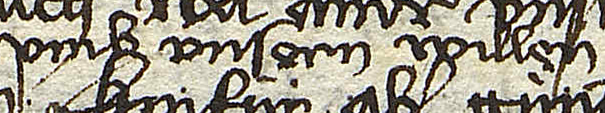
vmb vnſern willen
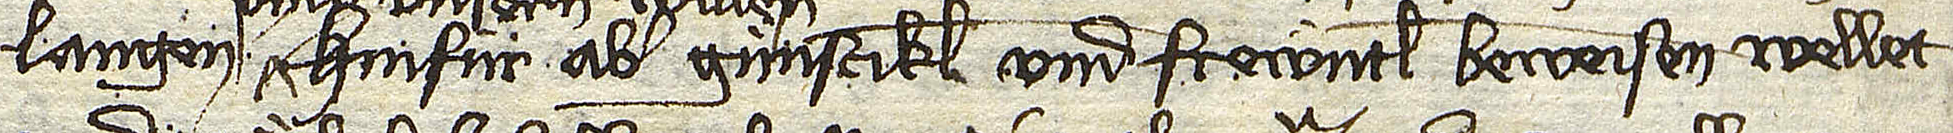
langen hinfür ab* günſtikl* vnd freẅnt* beweiſen wellet
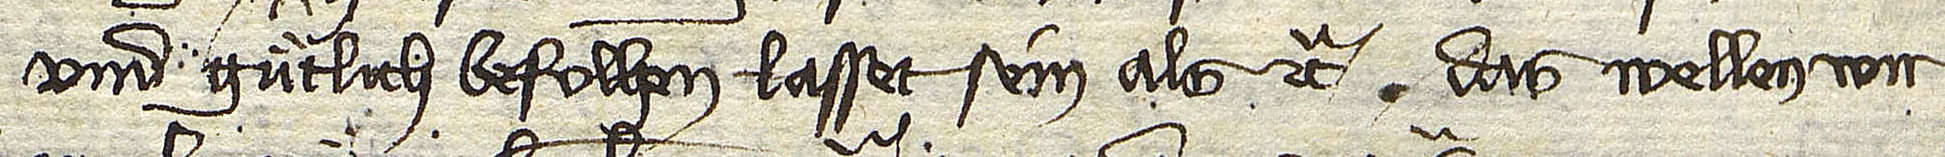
vnd gütlich befolhen laſſet sein als ec* . das wellen wir
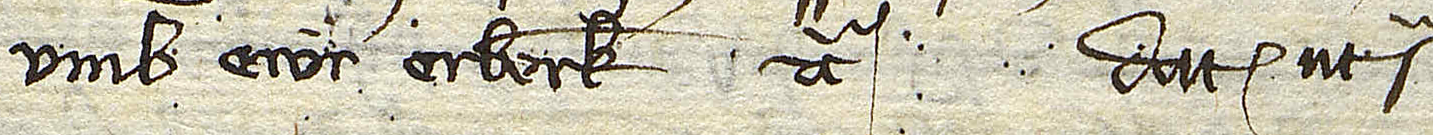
vmb eẅr erberk* ec* dat* ut ſ*
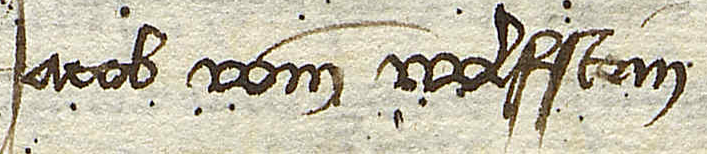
Iacob vom wolfſtein
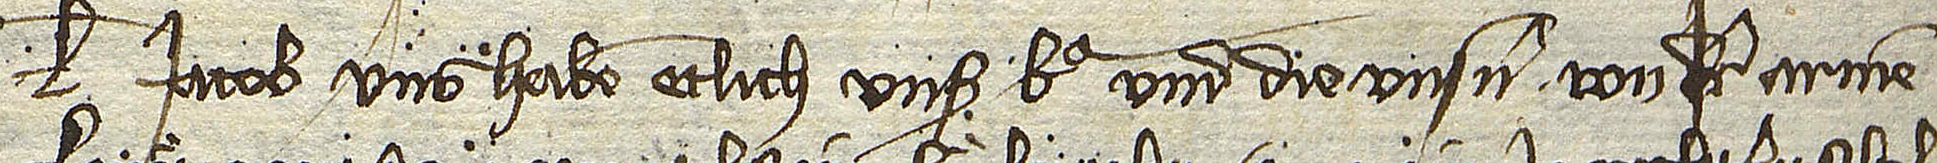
L* Iacob vns habe* etlich vnſ* b* vnd die vnſ*n von Ir* arme*n
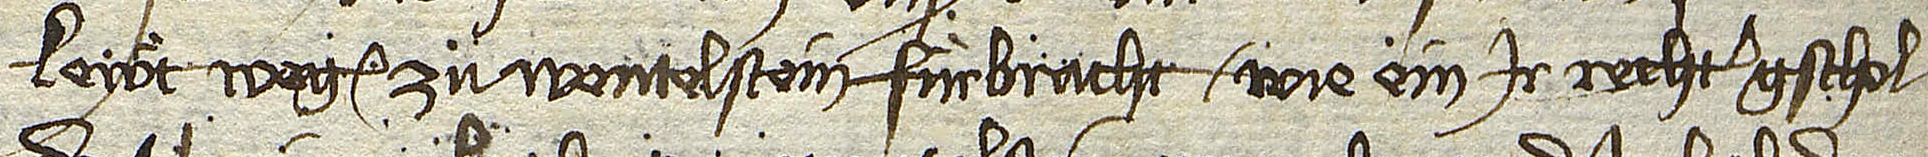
leẅt weg* ʒu wentelſtein fürbracht / wie ein Ir recht* g*ſthol
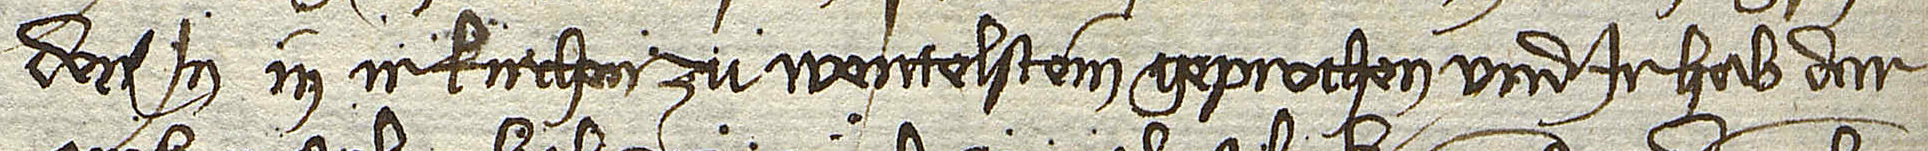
den In in ir knehen ʒu wentelſtein geprochen vnd Ir hab dar
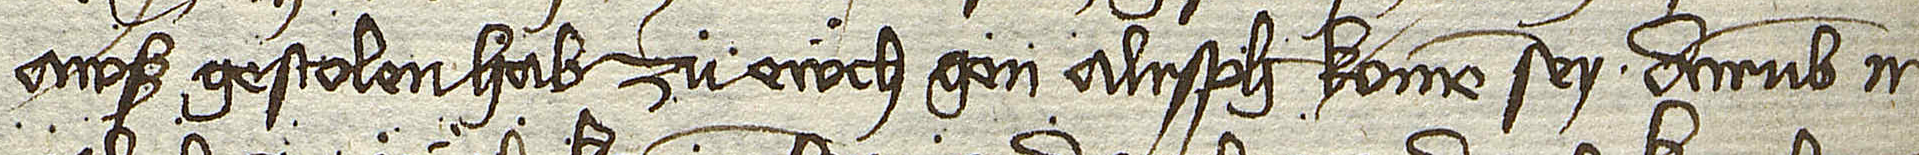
awſʒ geſtolen hab* ʒu eẅch gen alrſpg* kome* ſey . darub* ir
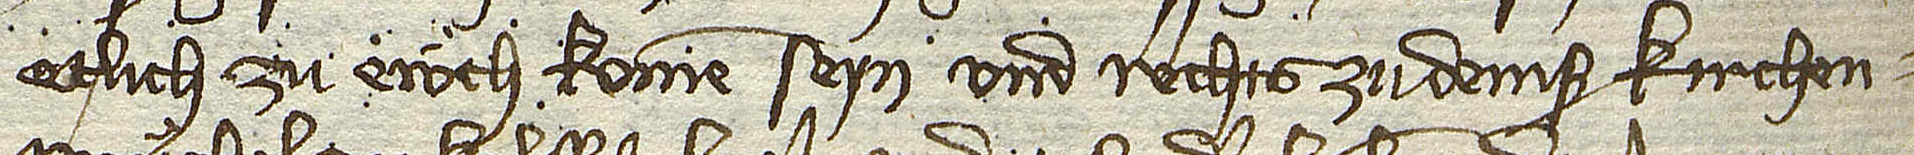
etlich ʒu eẅch kome* ſeyn vnd rechts ʒu demſ* knehen =
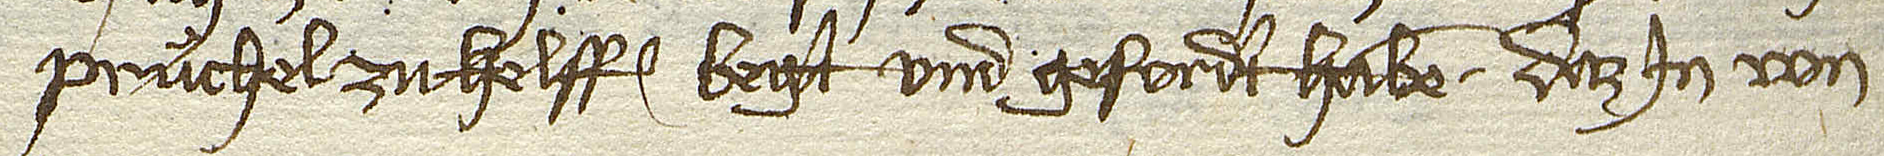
prüchel ʒu helff* begt* vnd geford*t habe* . daʒ In von
